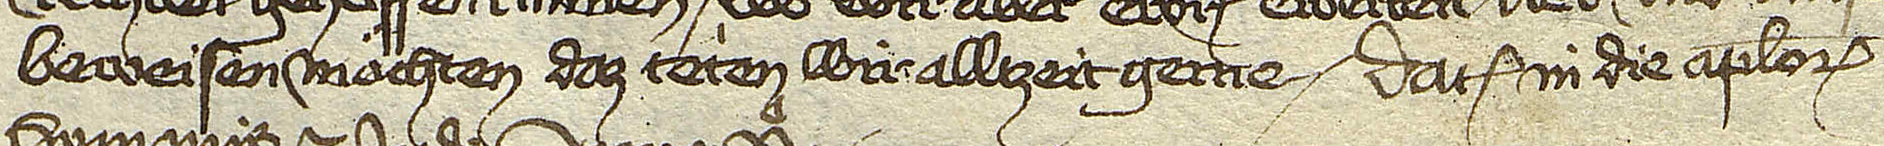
beweiſen möchten daʒ teten wir allcʒeit gerne / dat* in die aplo*
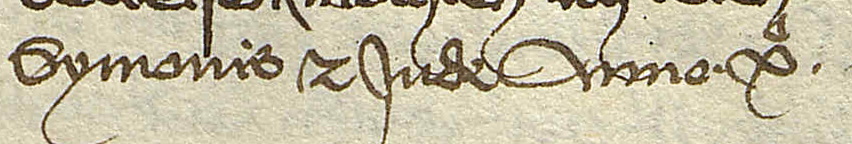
Symonis @ Iude Anno . x* . /
